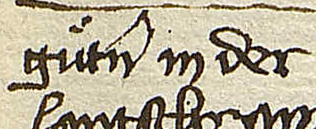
gütn* in der
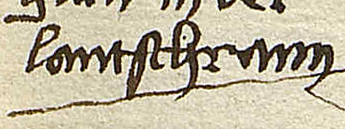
lantſchrann
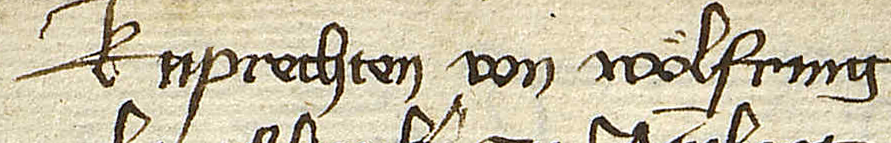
Ruprechten von wölfring
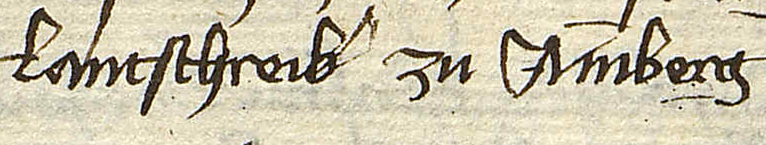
lantſchreib* ʒu Am*berg
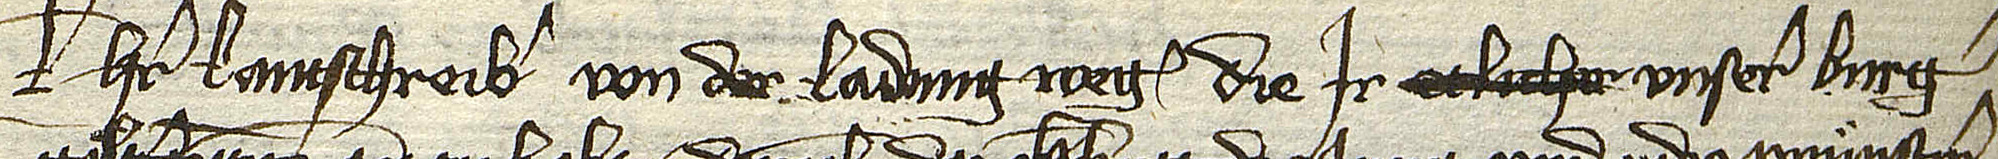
L* hr* lantſchreib* von der ladung weg* die Ir etlicher vnſer* burg*
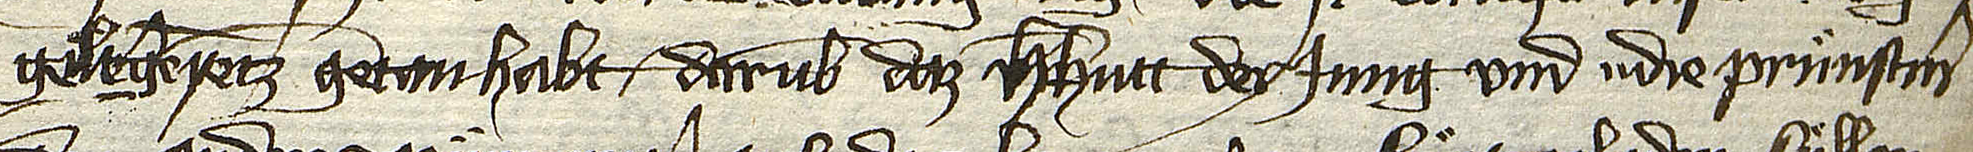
gelege* yecʒ* getan habt / daru* daʒ H Hutt der Iung vnd ~ die Prünſtm*
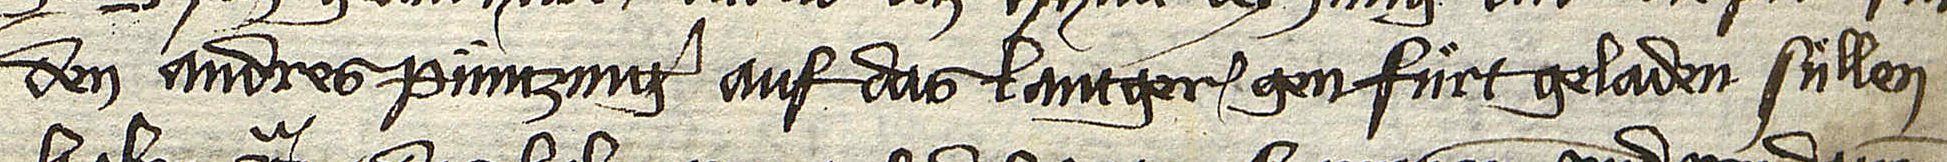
den andres Püncʒing* auf das lantger* gen fürt geladen ſüllen
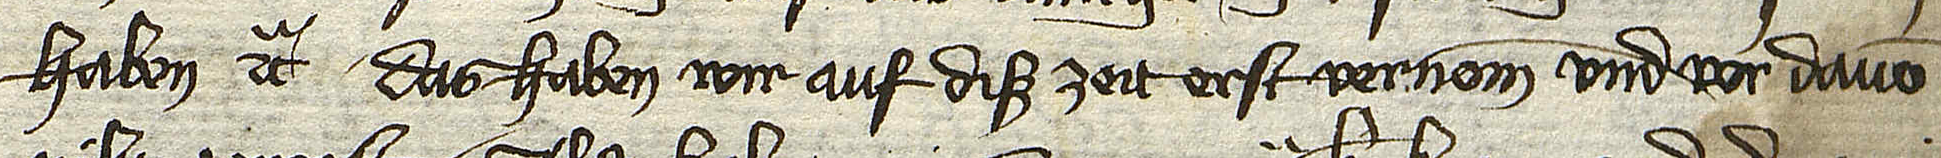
haben ec* / Das haben wir auf diſ* ʒeit erſt vernom* vnd vor dauo*
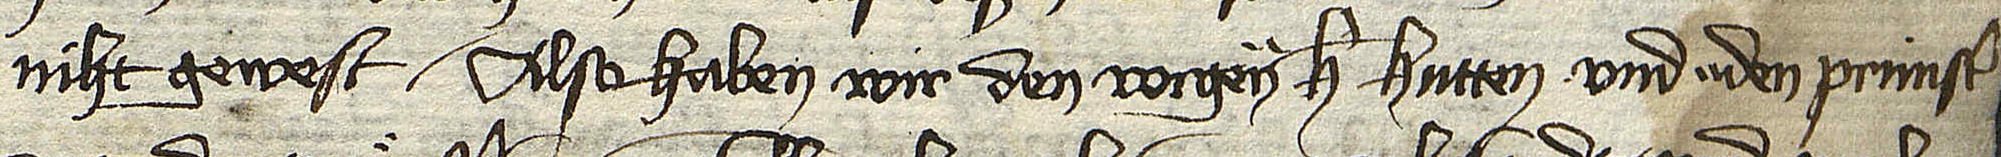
niht geweſt / Alſo haben wir den vorgen* H Hutten vnd ~ den prünſt*
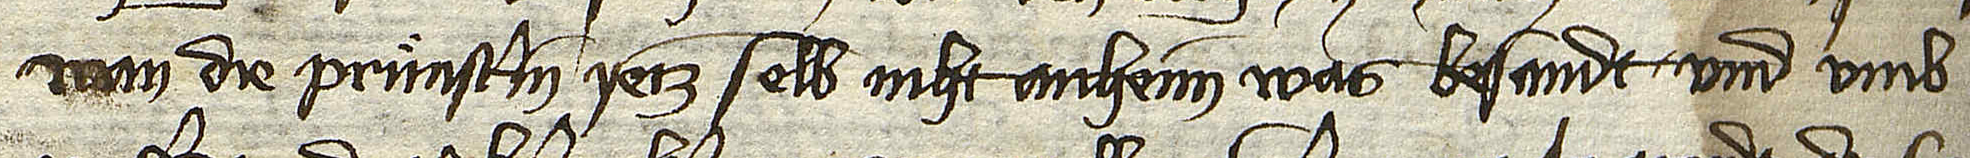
wan die Prünſt*in yecʒ* ſelb niht anheim was beſandt / vnd vmb
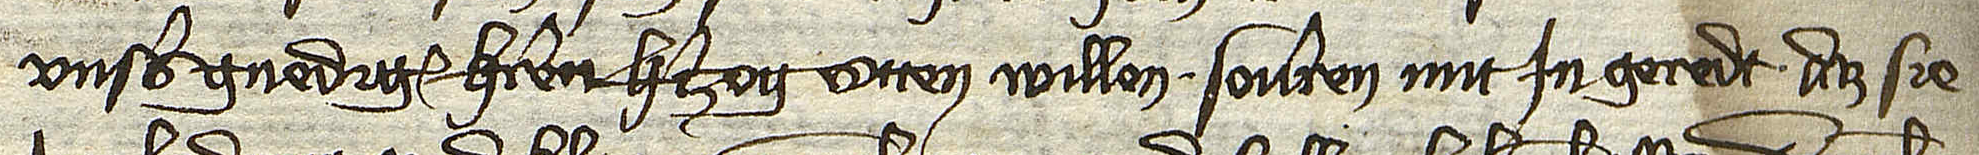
vnſs* gnedig* hr*en h*cʒog Otten willen . ſou*ren mit In geredt . daʒ ſie
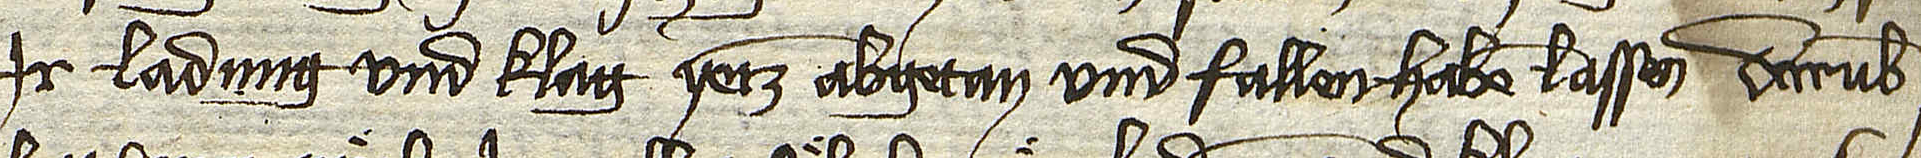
Ir ladung vnd klag yecʒ* abgetan vnd fallen habe* laſſen Darub*
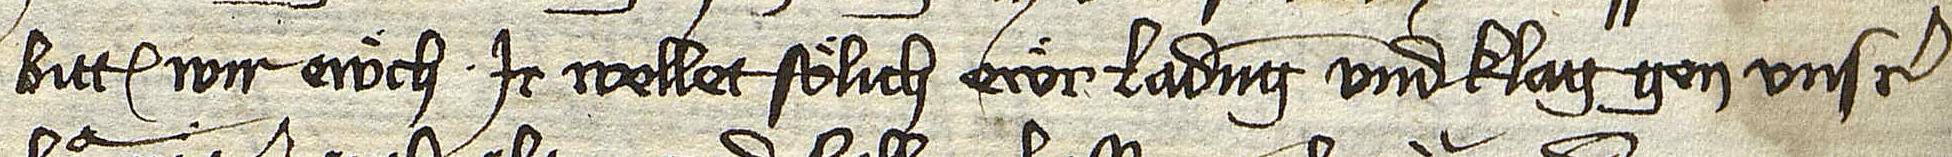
bitt* wir ewch . Ir wellet ſölich ewr ladug* vnd klag gen vnſr*
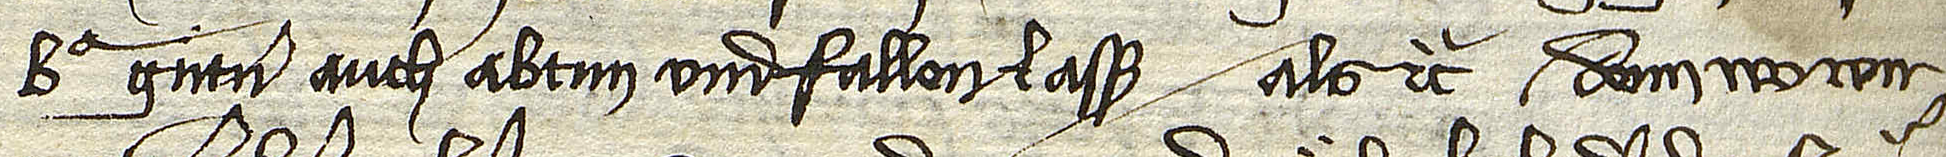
b* gütn* auch abtun vnd fallen laſſ* / als ec* / Denn wo wir
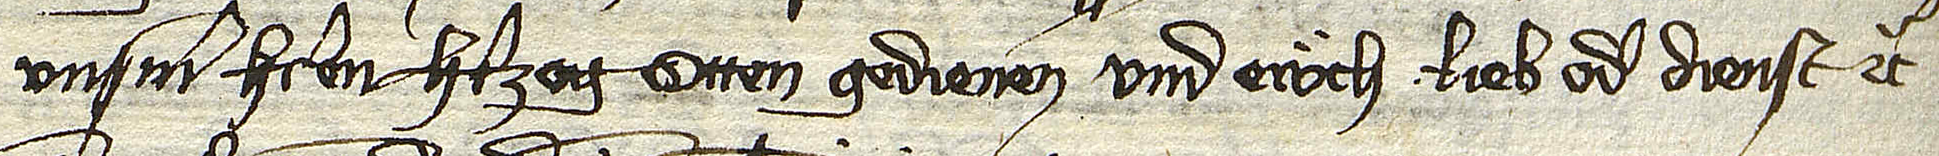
vnſ*m hr*en hc*ʒog Otten gedienen vnd ewch lieb od* dienſt ec*
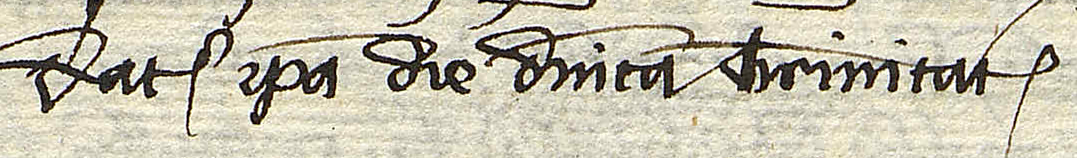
Dat* ipa* die dnica* Trinitat*
